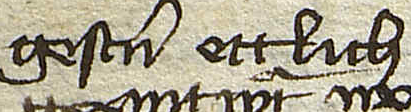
geſt*n ettlich
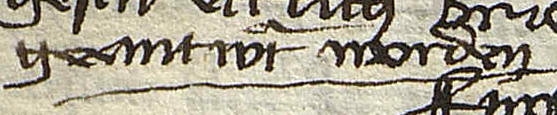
geantw*t worden
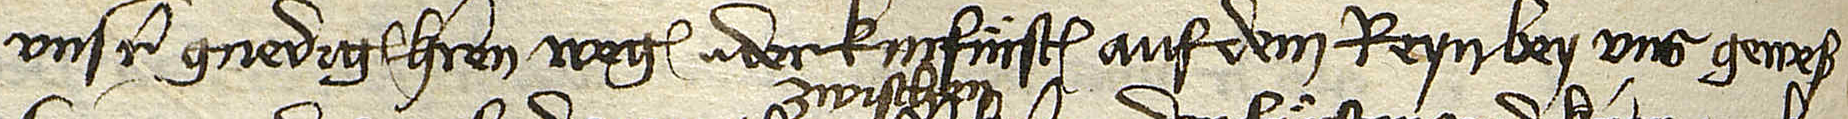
vnſ*r gnedig* h*ren weg* ~der kurfürſtl* auf dem Reyn bey vns geweſ*
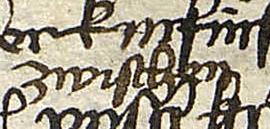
ʒwiſchen
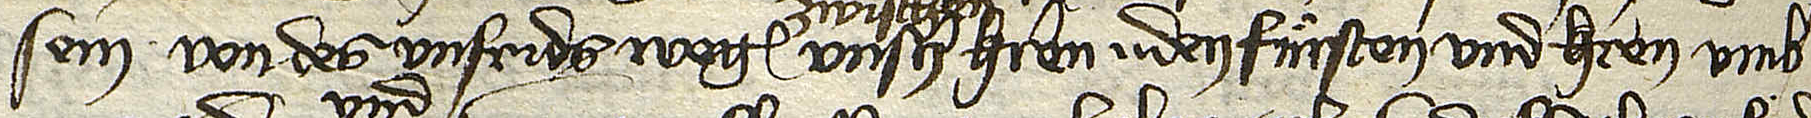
ſein . von des vnfrids weg* vnſ*n h*ren ~ den fürſten vnd h*ren vmb
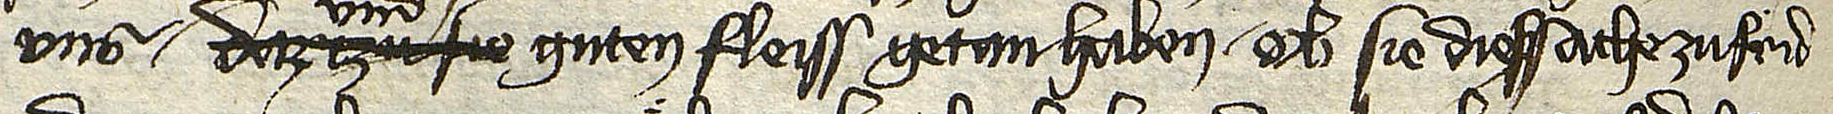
vns / Daʒ cʒu ſie guten fleiſſ getan haben / Ob ſie dieſ* ſache ʒu frid
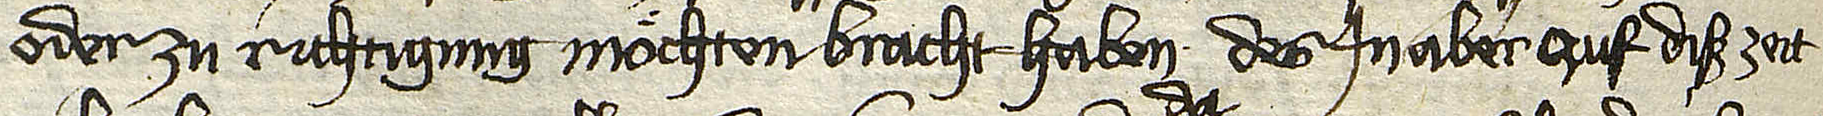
oder ʒu richtigung möchten bracht haben . des In aber auf diſʒ ʒeit
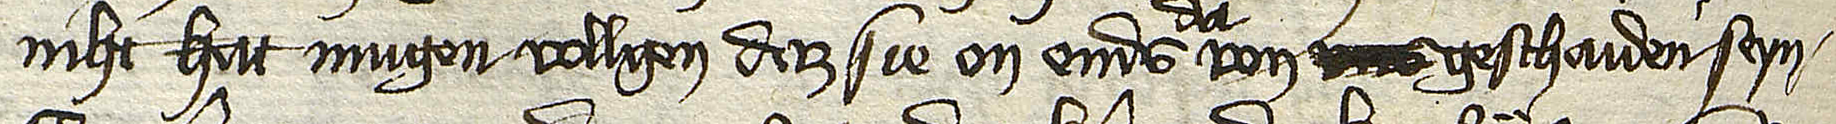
niht hat mugen vollgen daʒ ſie on ends von vns geſchaiden ſeyn /
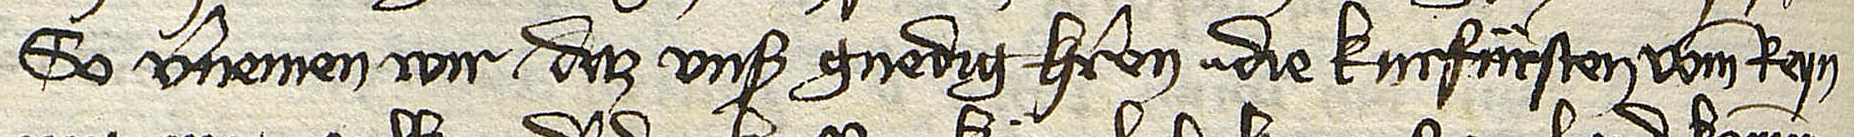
So v*nemen wir / daʒ vnſ* gnedig h*ren ~ die kurfürſten vom* Reyn
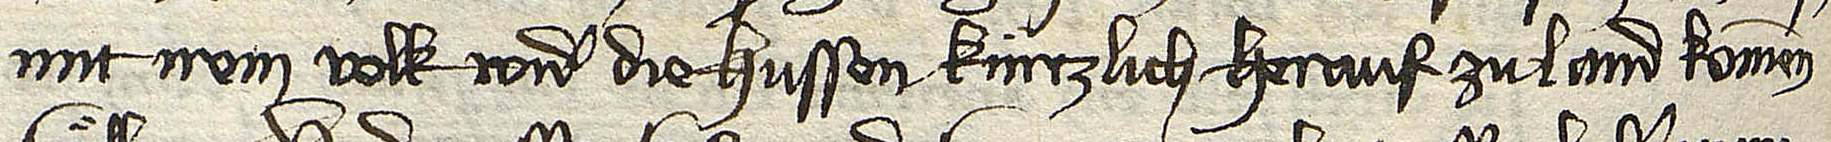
mit irem volk wid* die huſſen kürcʒlich herauf ʒu land komen*
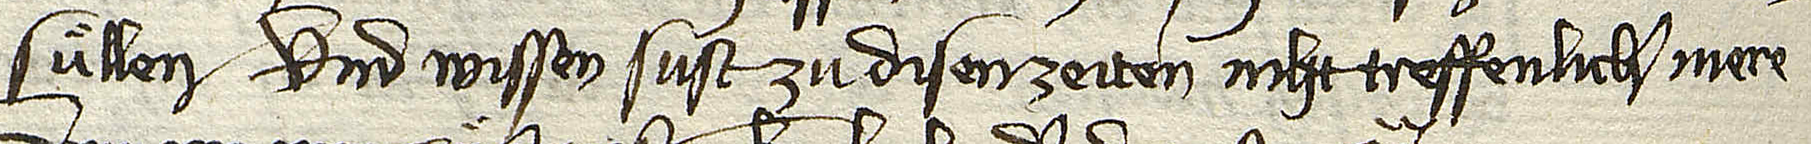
ſüllen / Vnd wiſſen ſuſt ʒu diſen ʒeiten niht treffenlich* mere
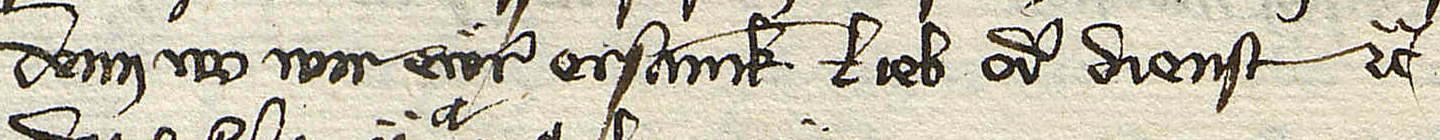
Denn wo wir ewr* erſamk* lieb* od* dienſt ec*
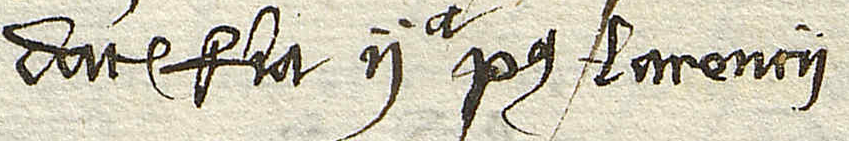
dat* fia* ii* p* larencii
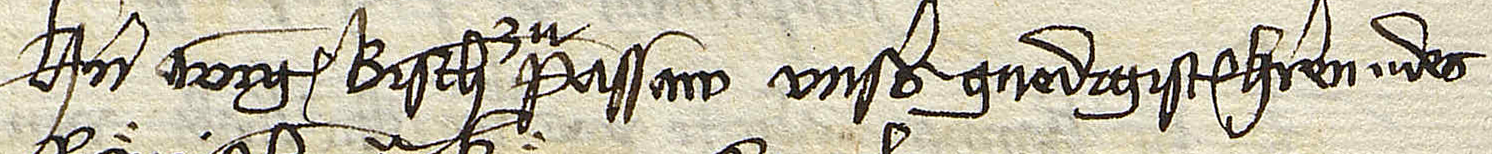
H*n Gorg* Biſch* Paſſaw vnſ*s gnedigiſt* h*ren ~ des
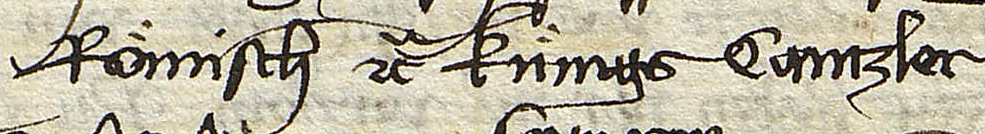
Römiſch* ec* künigs Cancʒler
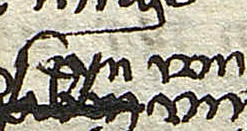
ſeyn von
